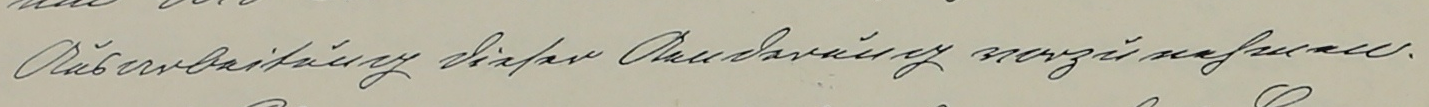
Ausarbeitung dieser Aenderung vorzunehmen.
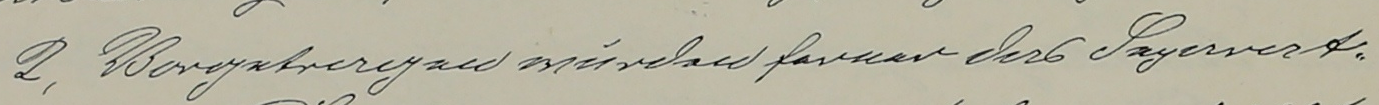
2. Vorgetragen wurden ferner das Separat-
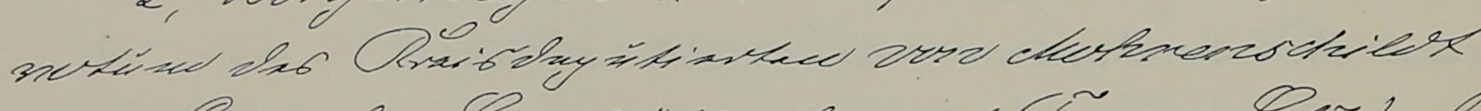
votum des Kreisdeputierten von Mohrenschildt
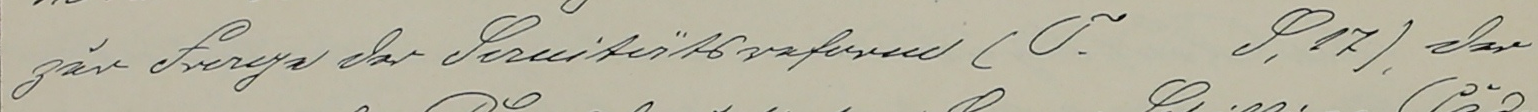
zur Frage der Sanitätsreform (T. S.17), der
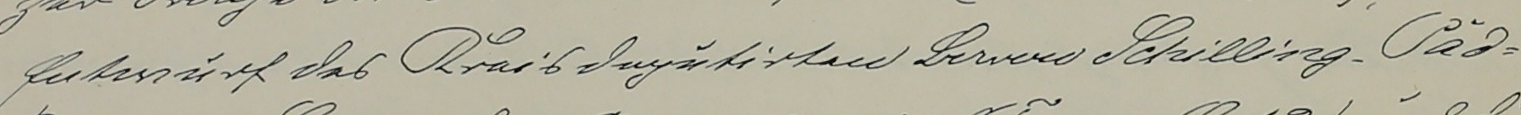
Entwurf des Kreisdeputirten Baron Schilling-Pad-
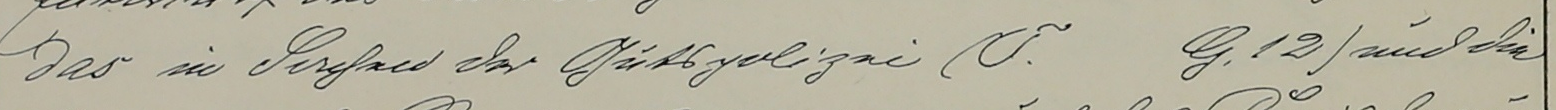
das in Sachen der Gutspolizei (T. G.12) und die
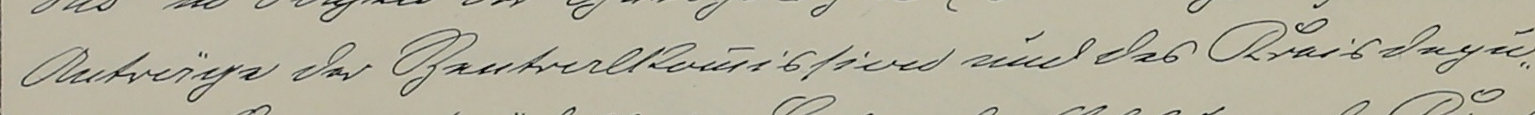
Anträge der Zentralkommission und des Kreisdepu-
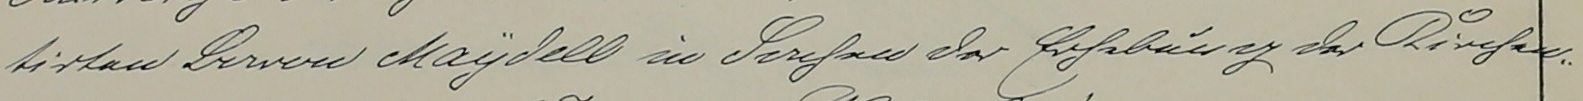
tirten Baron Maydell in Sachen der Erhebung der Kirchen-
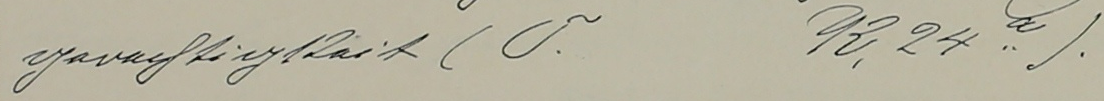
gerechtigkeit (T. K.24a).
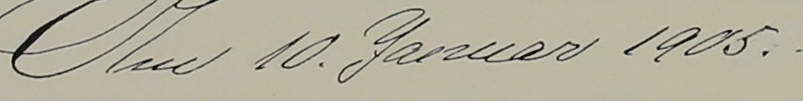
Am 10. Januar 1905.
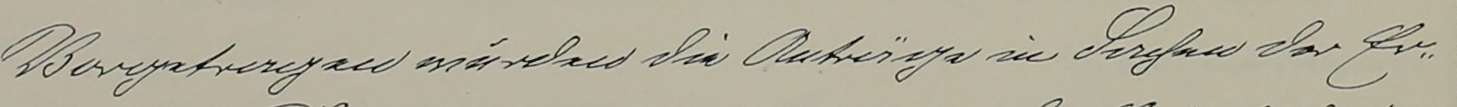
Vorgetragen wurden die Anträge in Sachen der Er-
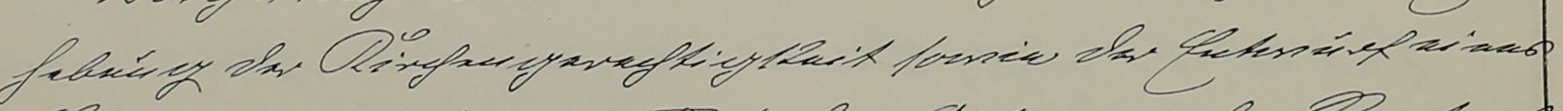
hebung der Kirchengerechtigkeit sowie der Entwurf eines
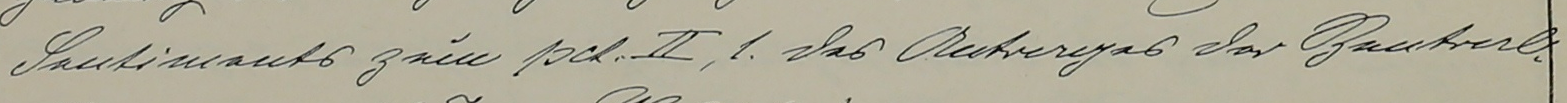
Sentiments zum pct. II,1. des Antrags der Zentral-
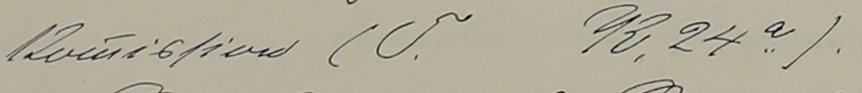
kommission (T. K.24a).
